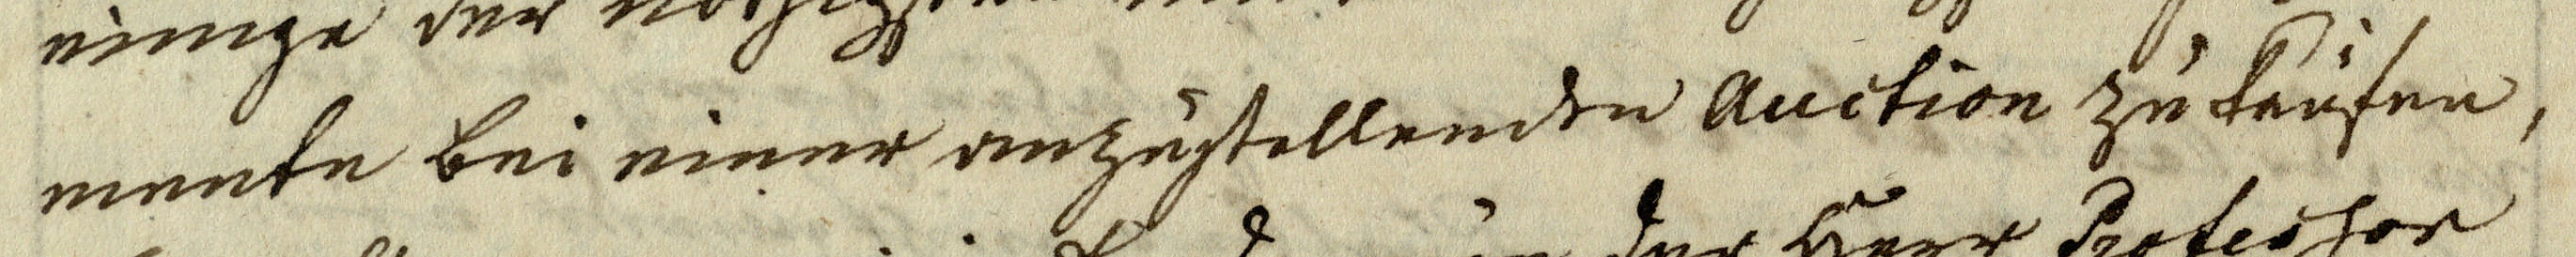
mente bei einer anzustellenden Auction zu kaufen,
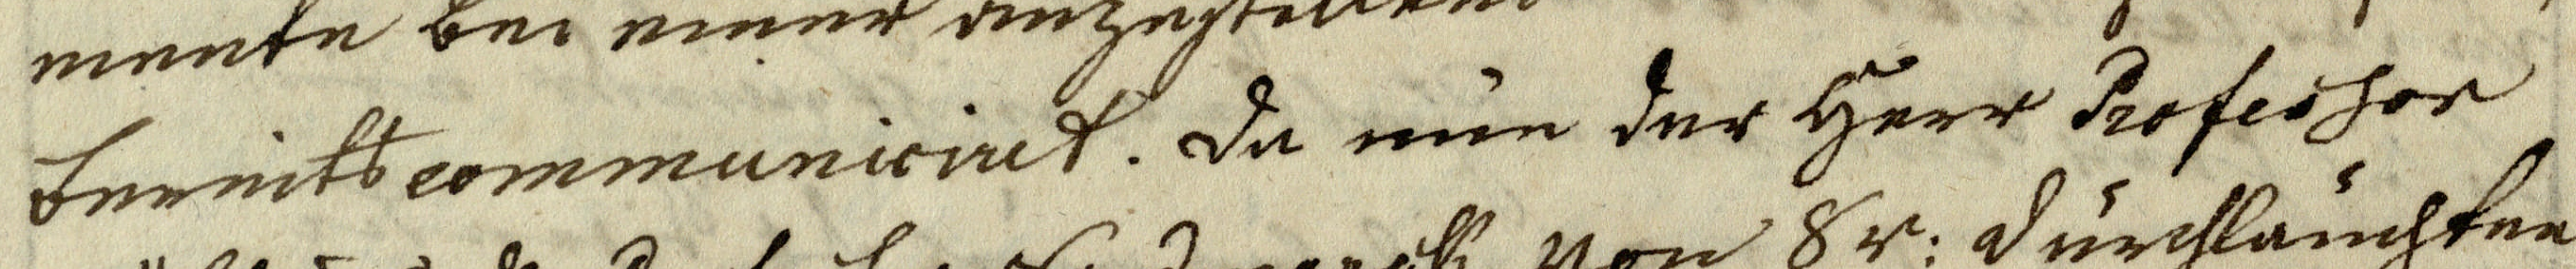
bereits communiciret. Da nun der Herr Professor
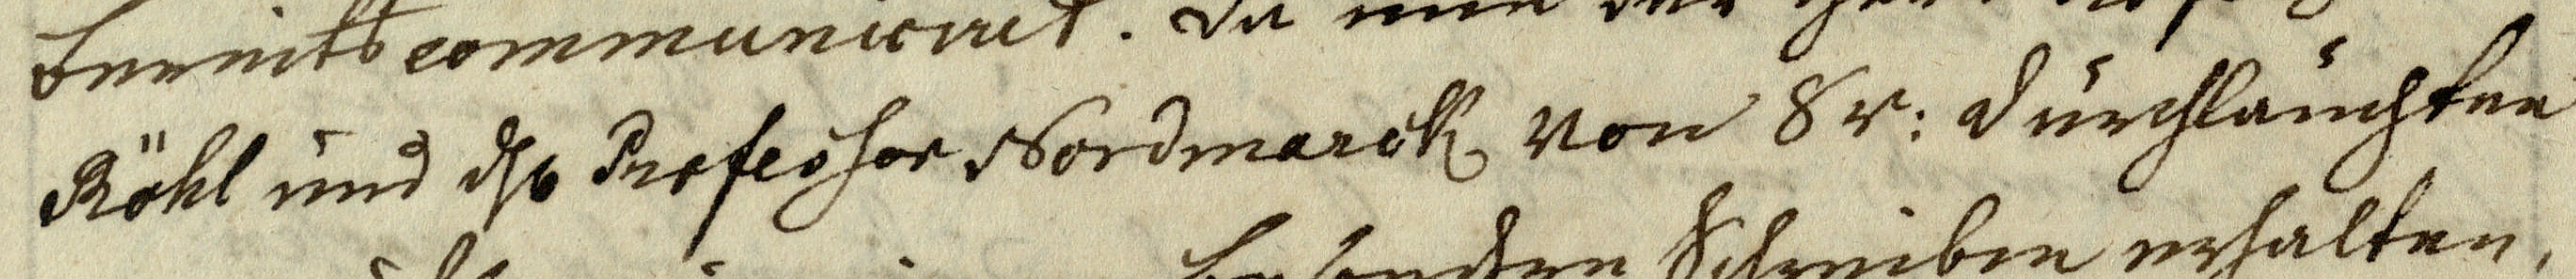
Röhl und dh Professor Nordmarck von Sr. Durchlauchten
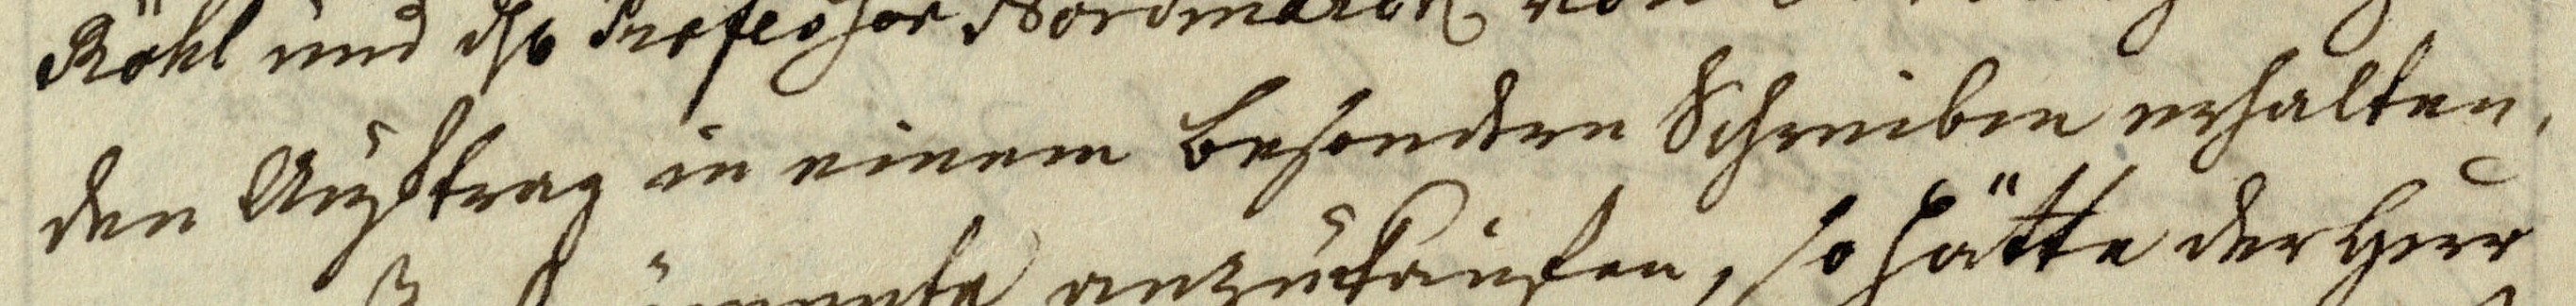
den Auftrag in einem besondern Schreiben erhalten,
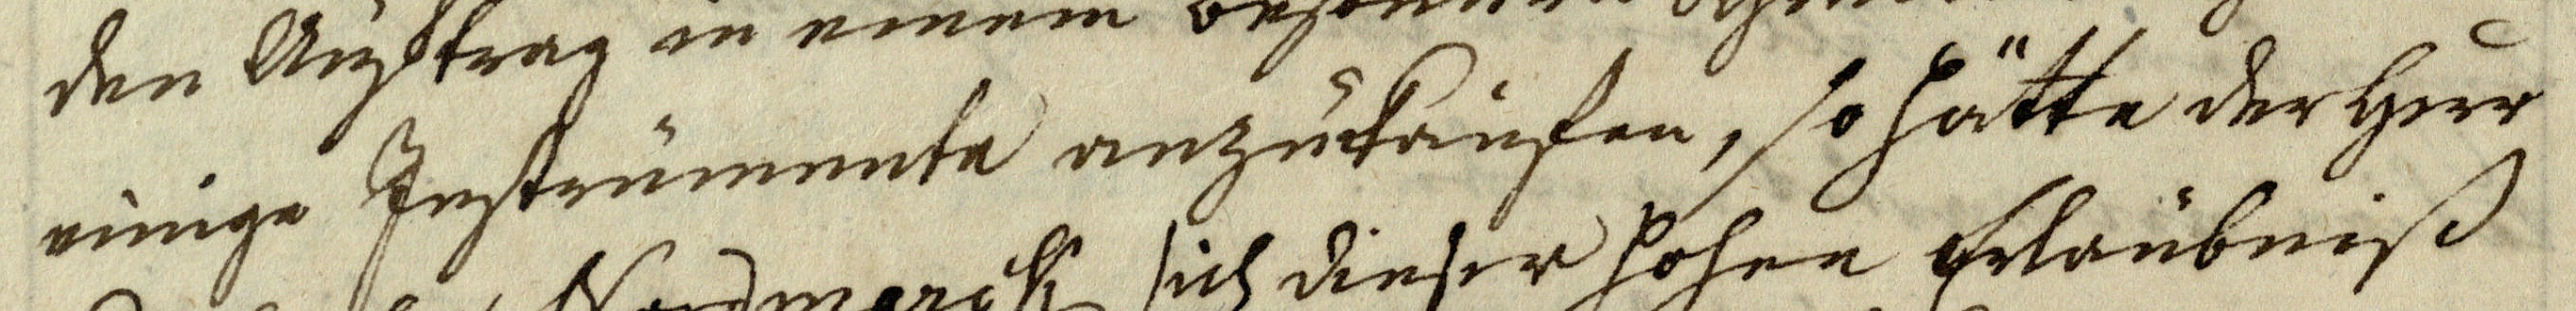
einige Instrumente anzukaufen, so hätte der Herr
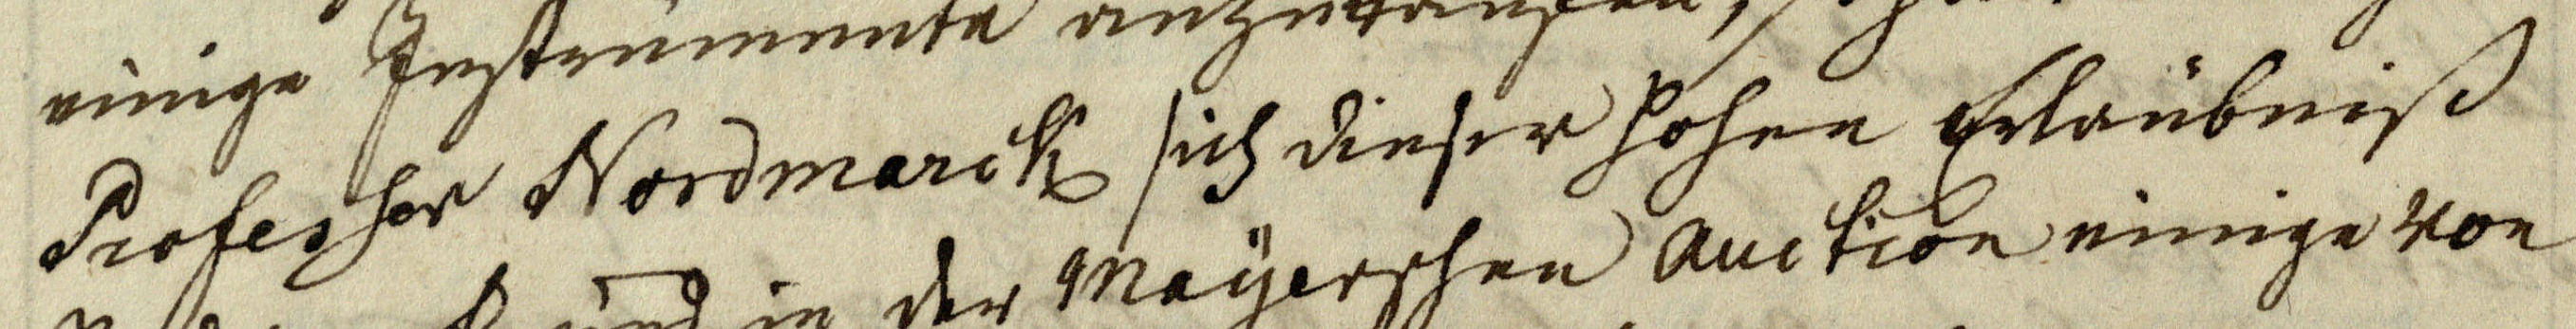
Professor Nordmarck sich dieser hohen Erlaubniß
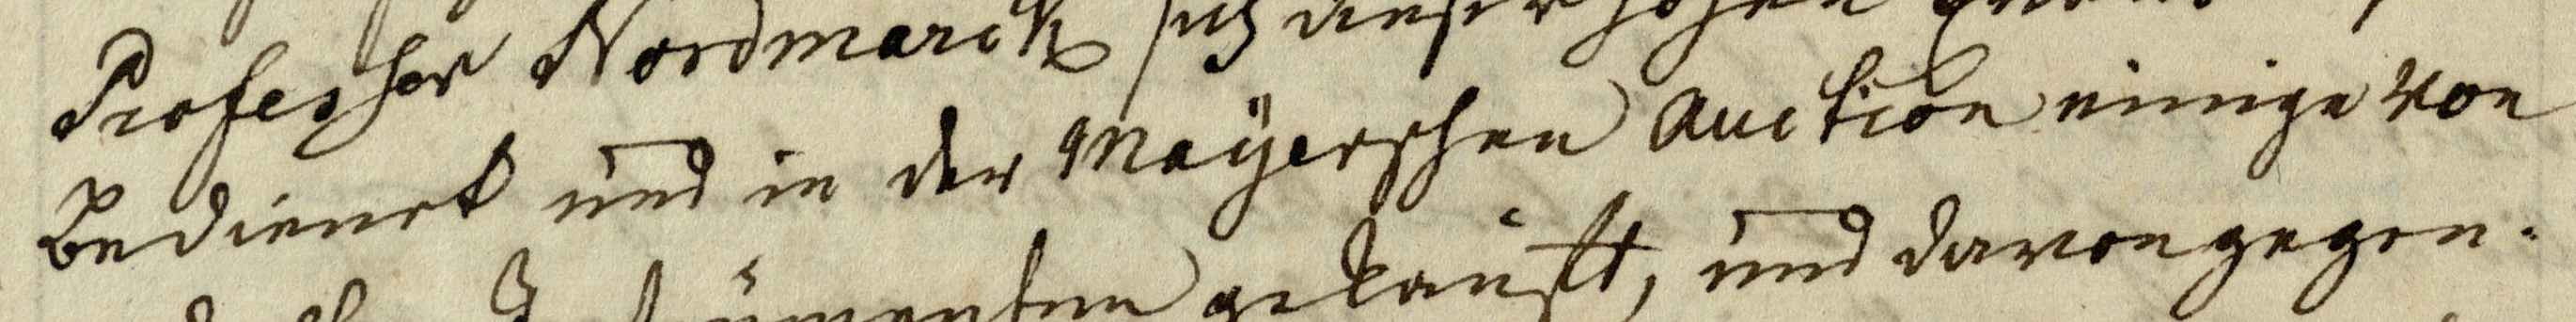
bedienet und in der Maÿerschen Auction einige von
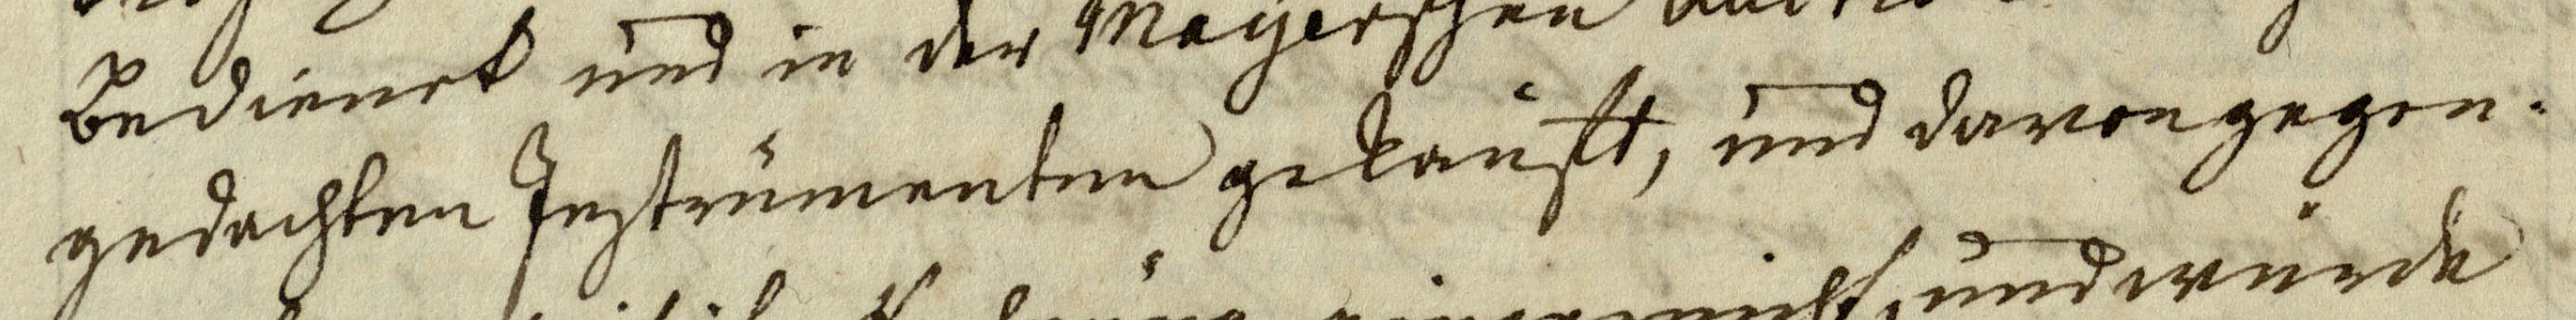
gedachten Instrumenten gekauft, und davon gegen¬
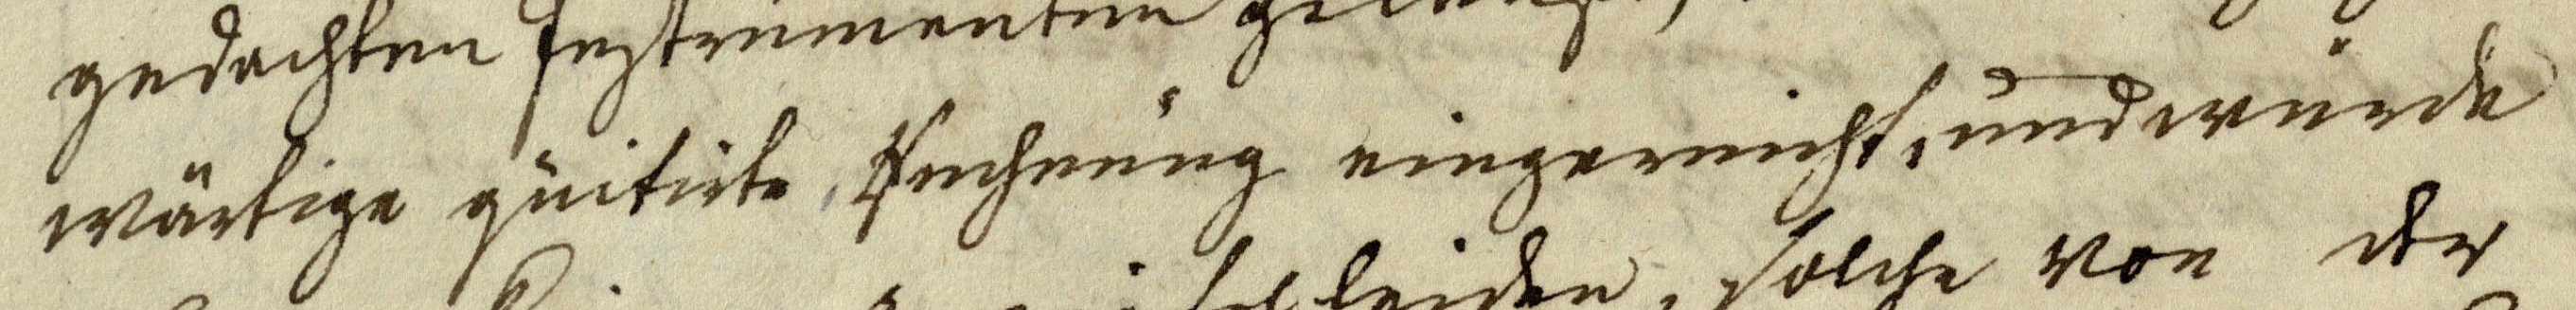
wärtige quitirte Rechnung eingereicht, und würde
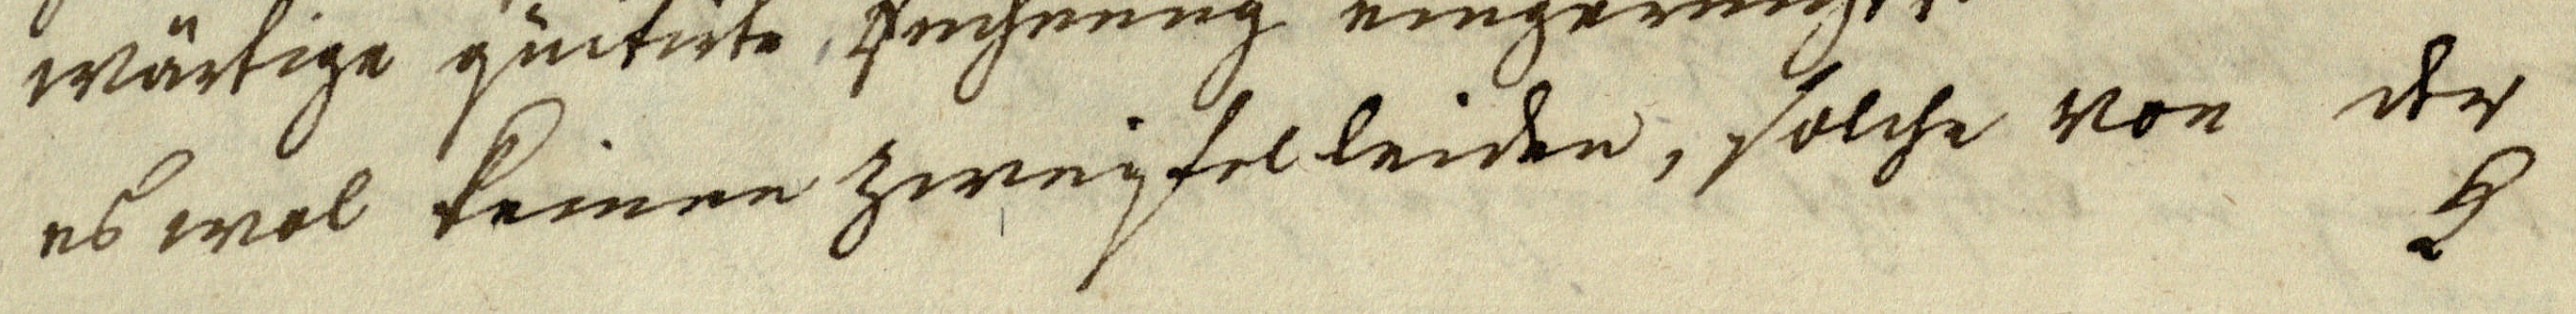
es wol keinen Zweifel leiden, solche von der
